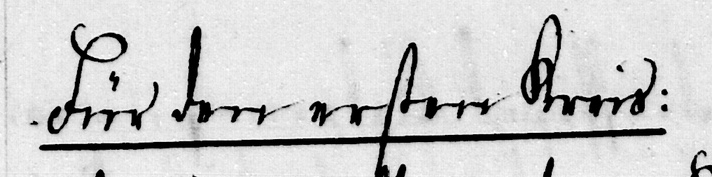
Für den ersten Kreis:
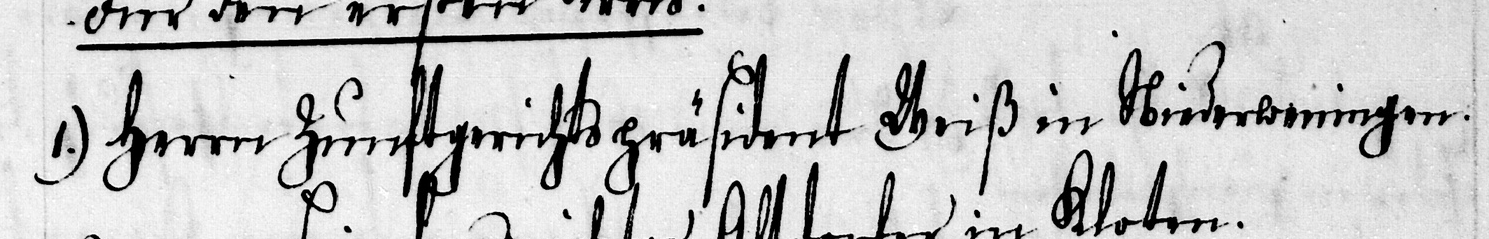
1.) Herrn Zunftgerichtspräsident Weiß in Niederweningen.
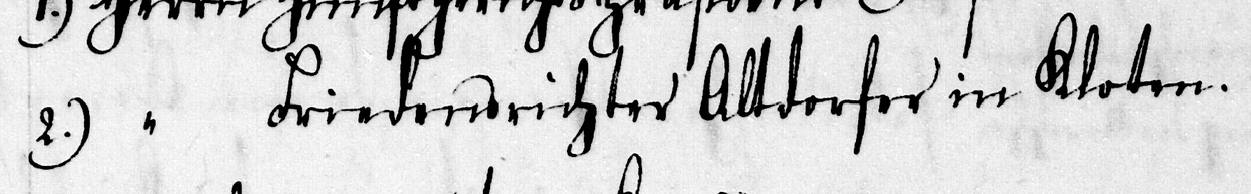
2.) “ Friedensrichter Altdorfer in Kloten.
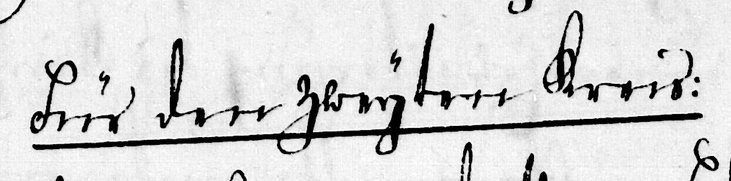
Für den zweyten Kreis:
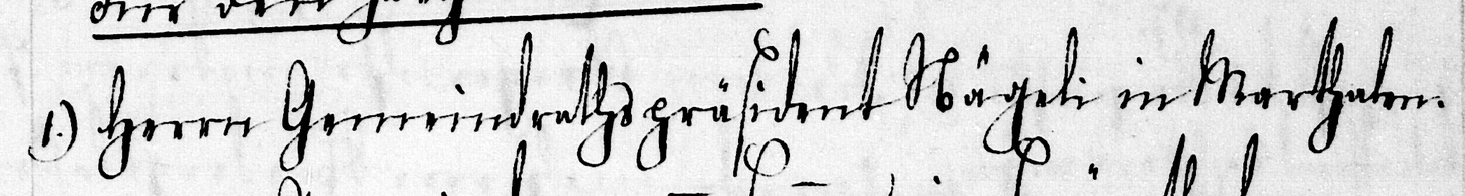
1.) Herrn Gemeindrathspräsident Nägeli in Marthalen.
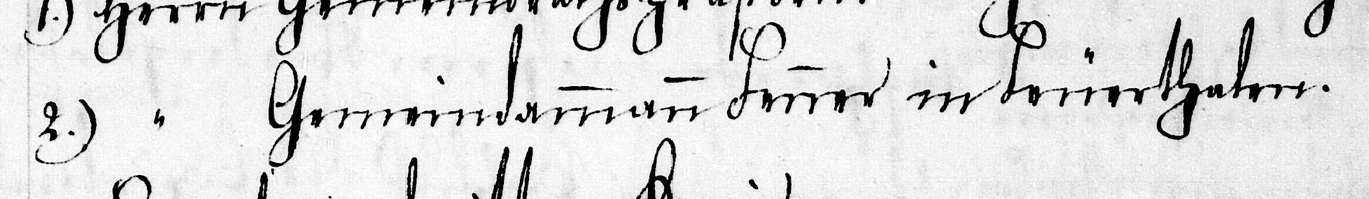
2.) “ Gemeindammann Furrer in Feuerthalen.
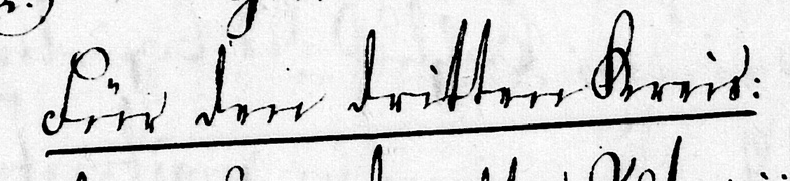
Für den dritten Kreis:
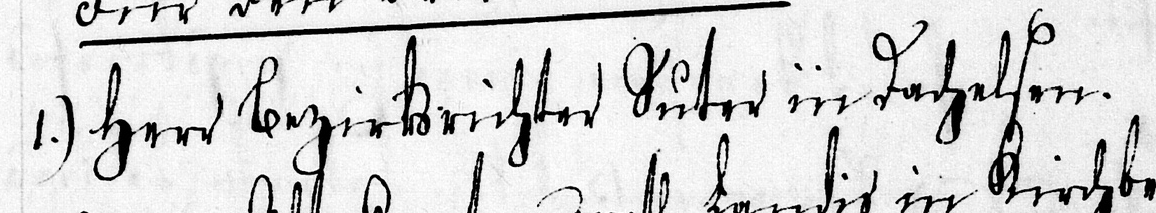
1.) Herr Bezirksrichter Suter in Dachelsen.
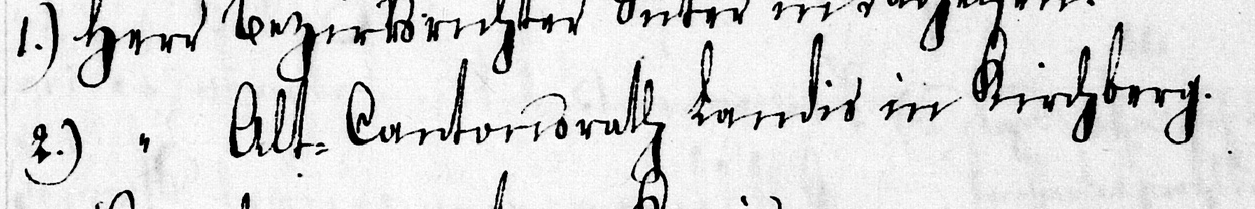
2.) “ Alt-Cantonsrath Landis in Kirchberg.
